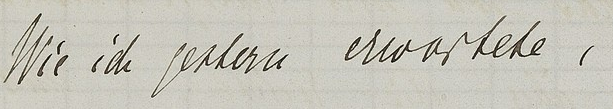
Wie ich gestern erwartete,
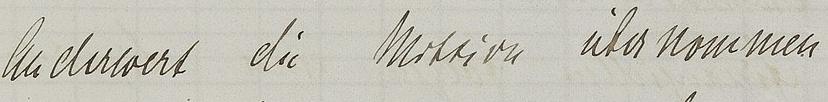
Anderwert die Mission übernommen.
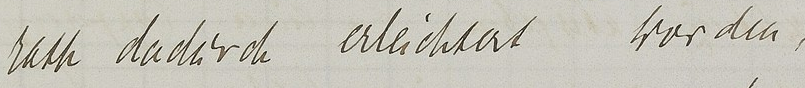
rath dadurch erleichtert worden,
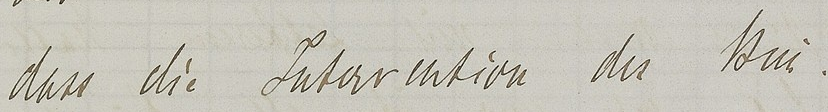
dass die Intervention des Bun-
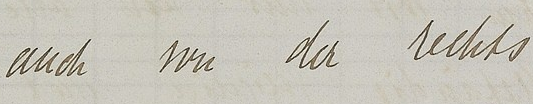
auch von der rechts-
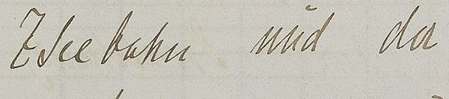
ZSeebahn und der
